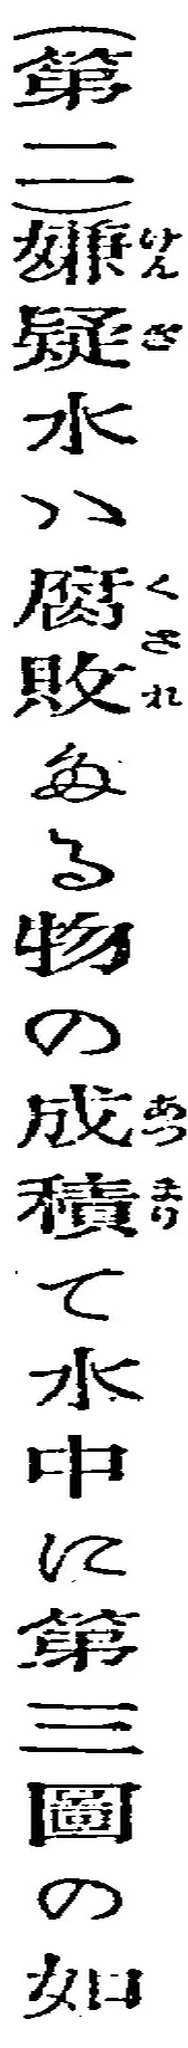[第二]嫌疑水は腐敗たる物の成績て水中に第三圖の如
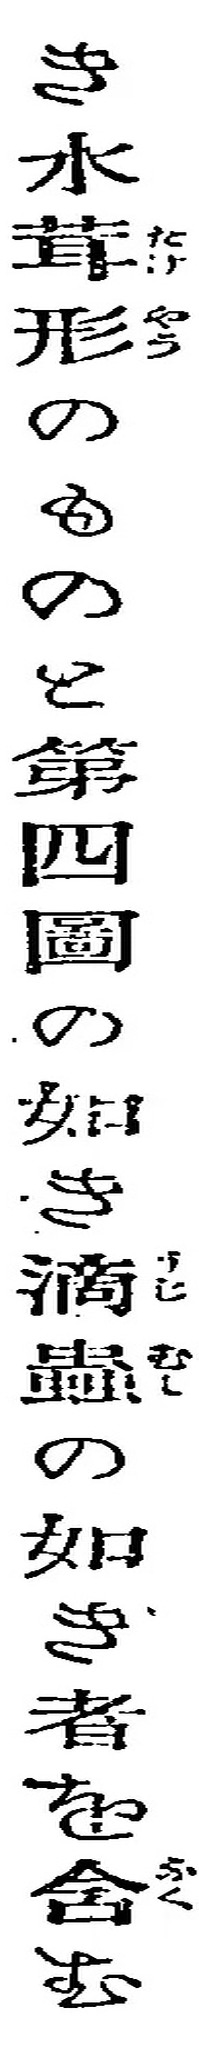き水茸形のものと第四圖の如き滴蟲の如き者を含む
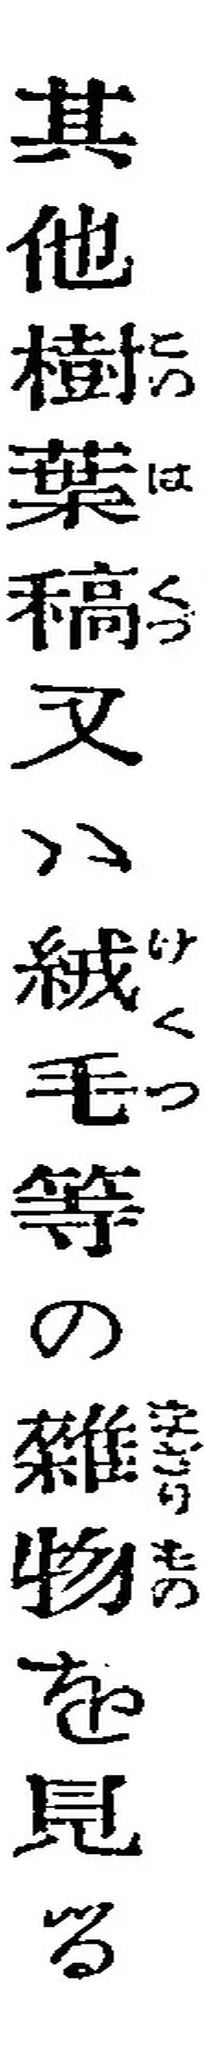其他樹葉稿又は絨毛等の雑物を見る
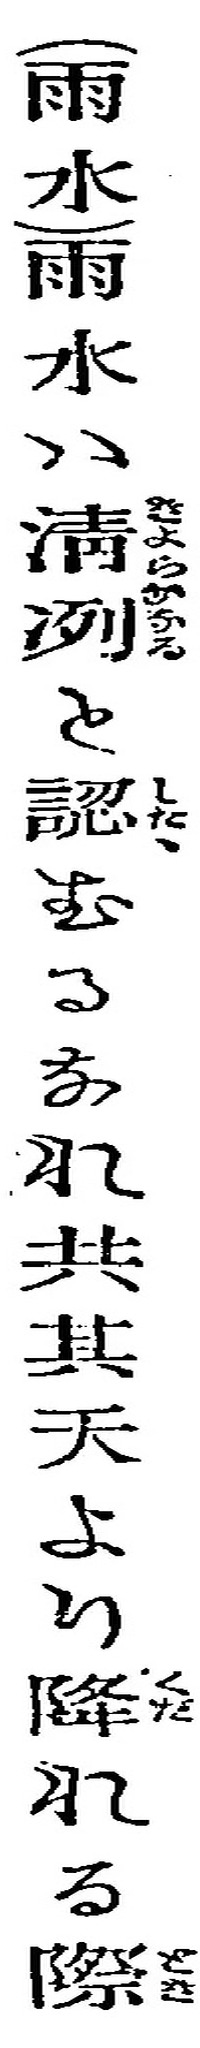[雨水]雨水は清冽と認むるなれ共其天より降れる際
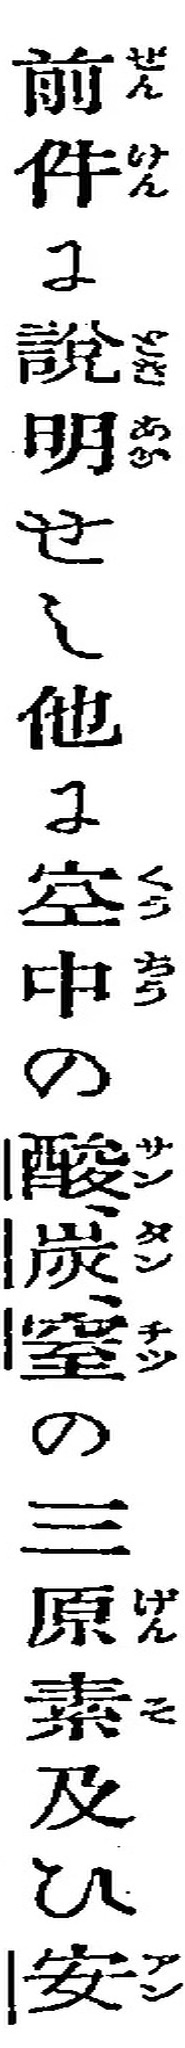前件に説明せし他に空中の酸、炭、窒の三元素及ひ安
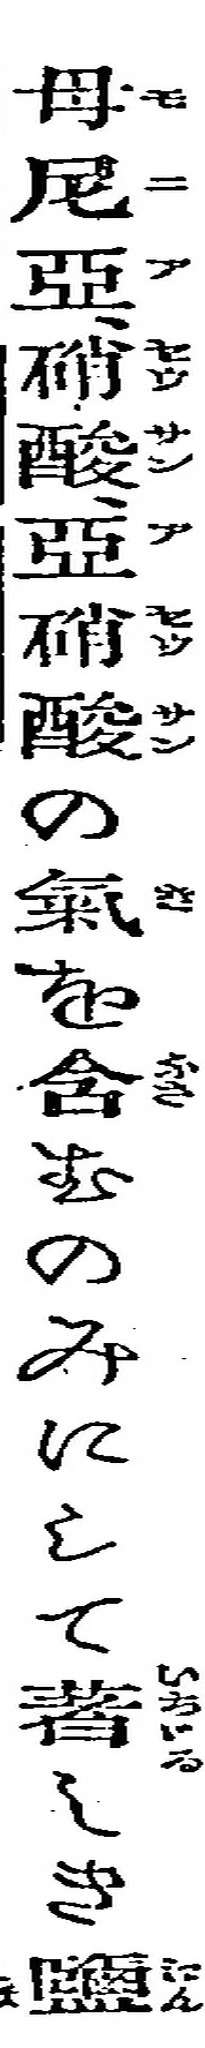母尼亜、硝酸、亜硝酸の氣を含むのみにして著しき鹽

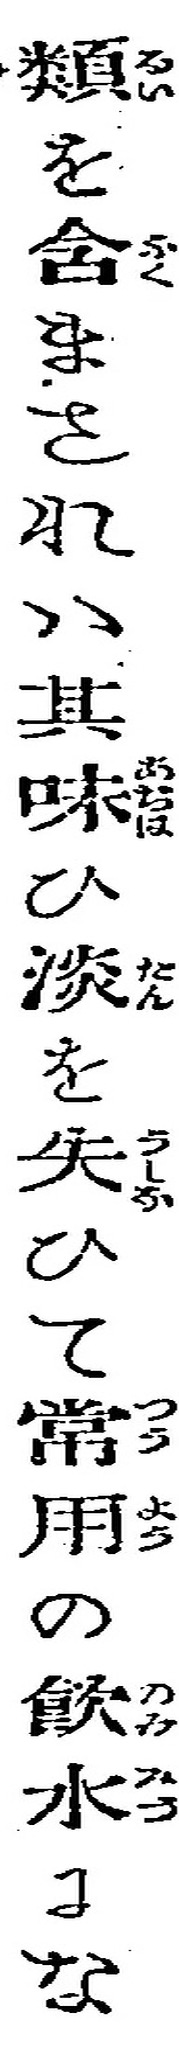類を含まされは其味ひ淡を失ひて常用の飲水にな
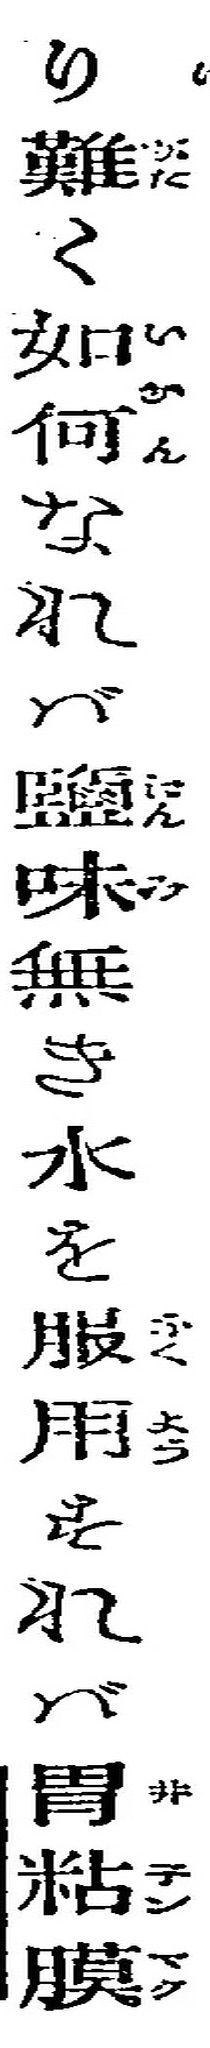り難く如何なれば鹽味無き水を服用すれば胃粘膜
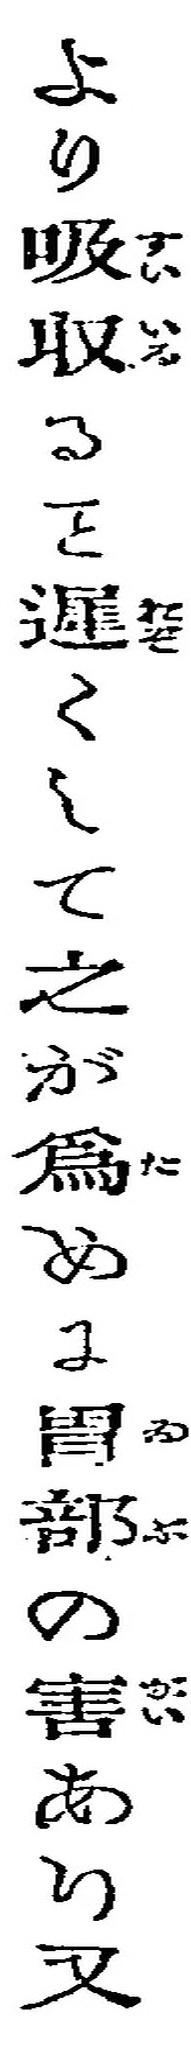より吸収ること遅くして之が為めに胃部の害あり又
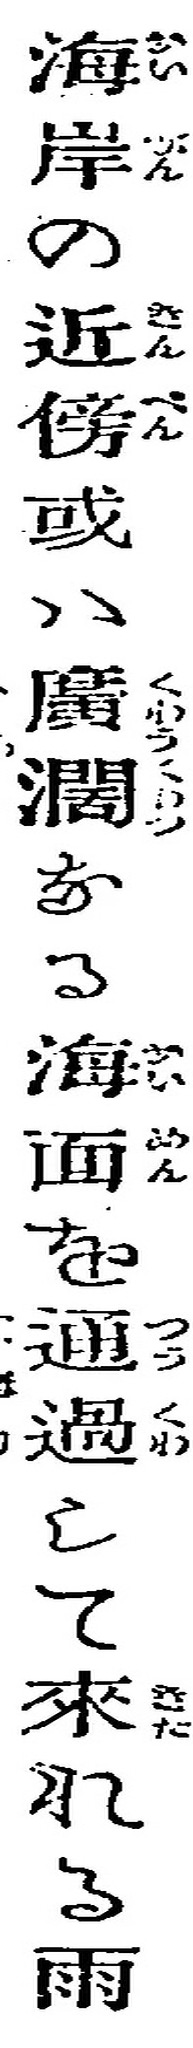海岸の近傍或は廣濶なる海面を通過して来れる雨
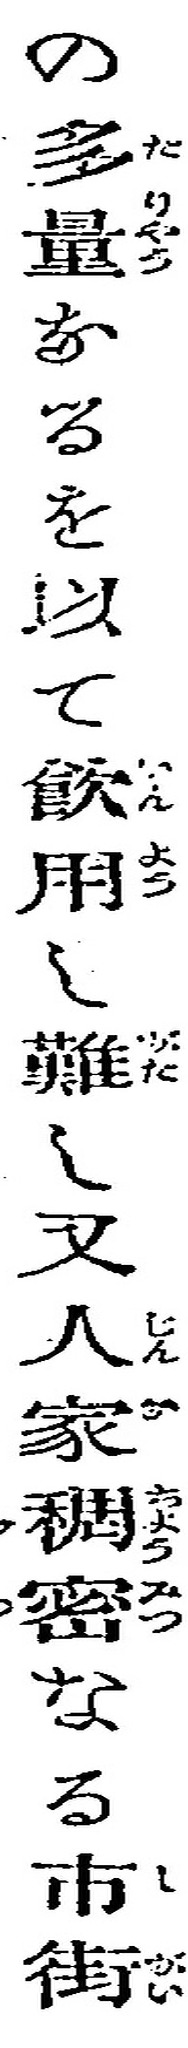の多量なるを以て飲用し難し又人家稠密なる市街
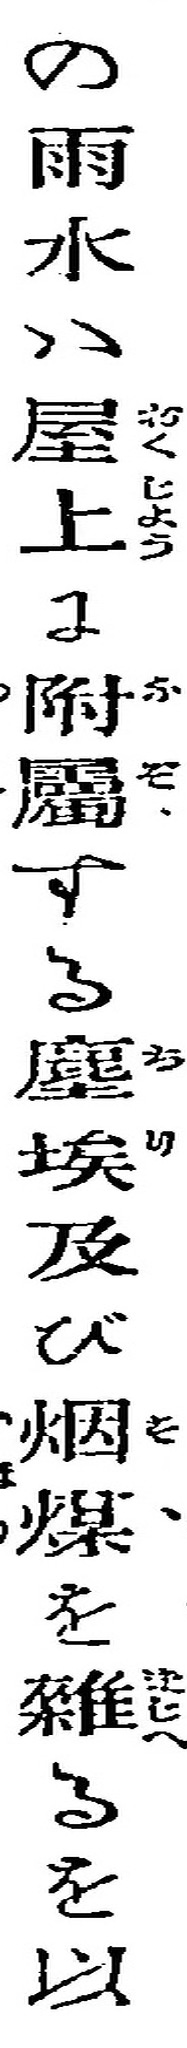の雨水は屋上に附屬する塵埃及び烟煤を雑るを以
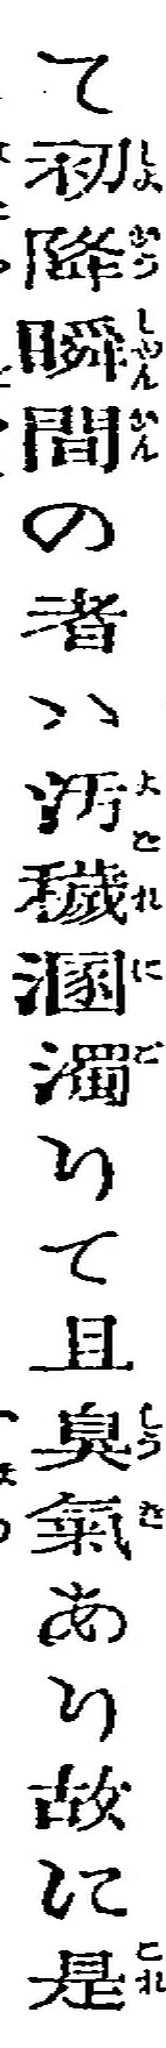て初降瞬間の者は汚穢溷濁りて且臭気あり故に是
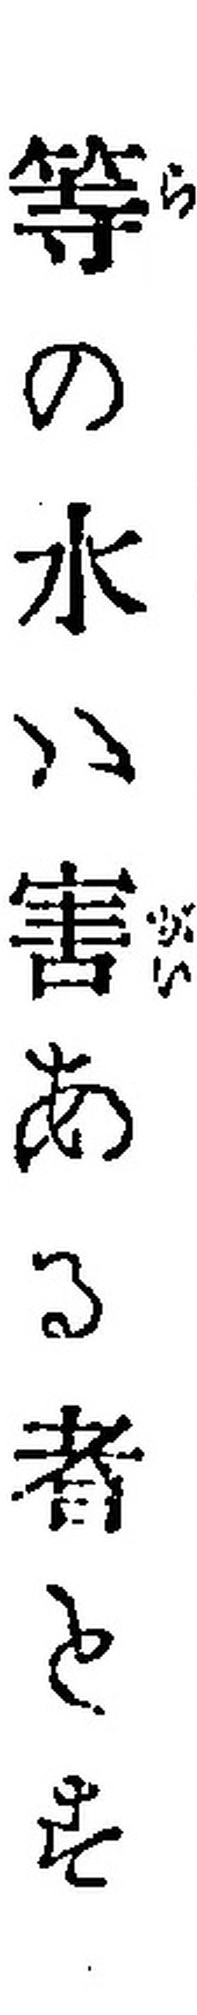等の水は害ある者とす
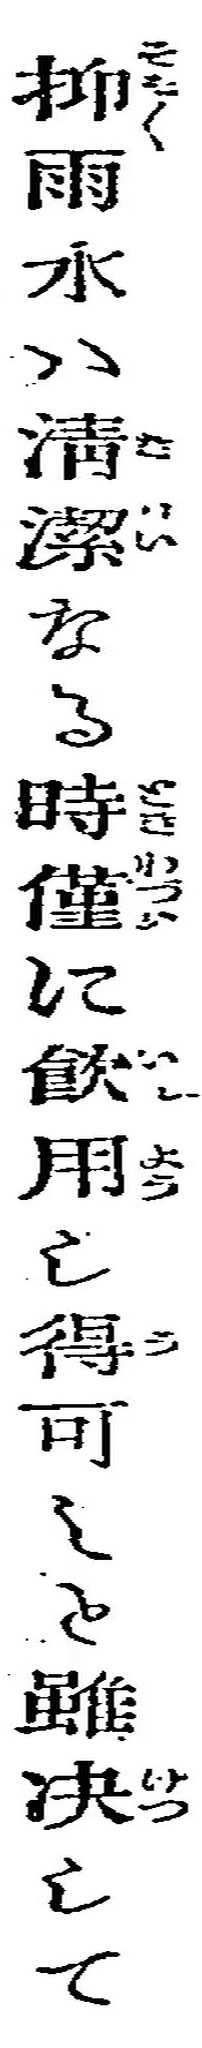抑雨水は清潔なる時僅に飲用し得可しと雖決して
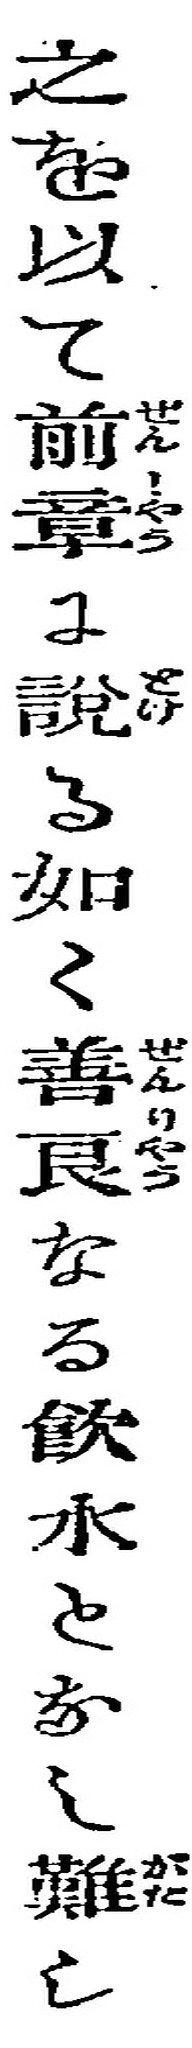之を以て前章に説る如く善良なる飲水となし難し
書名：飲水の心得 : 伝染病の予防
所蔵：国立国会図書館 National Diet Library, JAPAN
